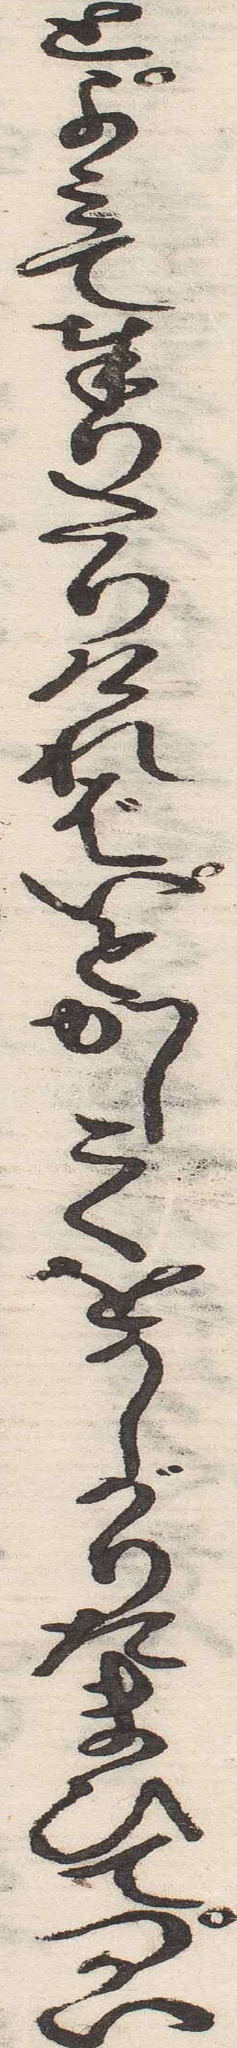と。よみて奉りたりければ。いとかしこくをかしがりたまひて。つかい
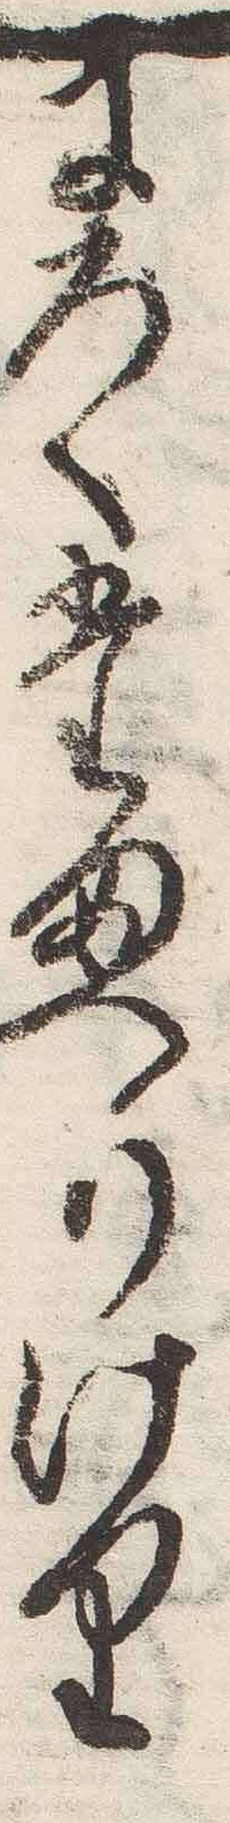にろくたまへりけり
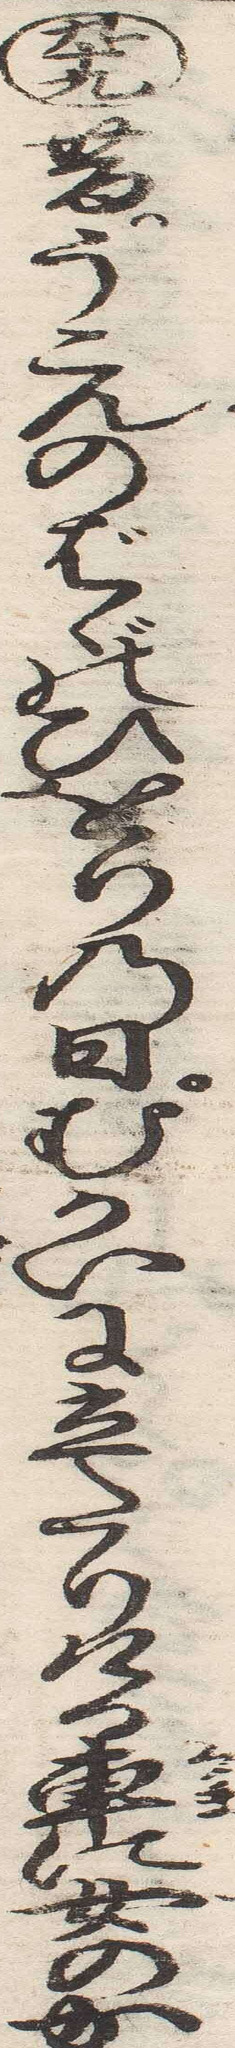九十九昔。うこんのばゞのひをりの日。むかいに立たりける車に女のか
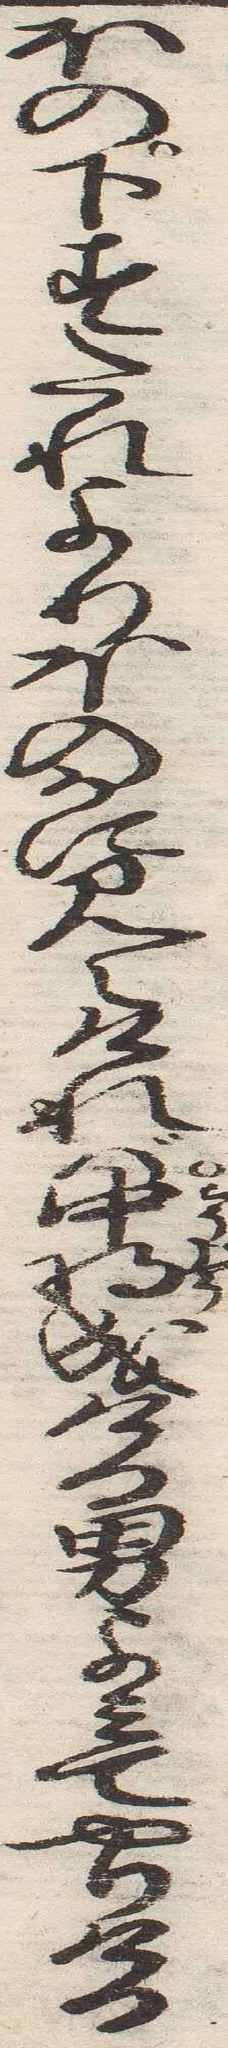ほの。下すたれよりほのかに見えければ。中将成ける男よみてやりける
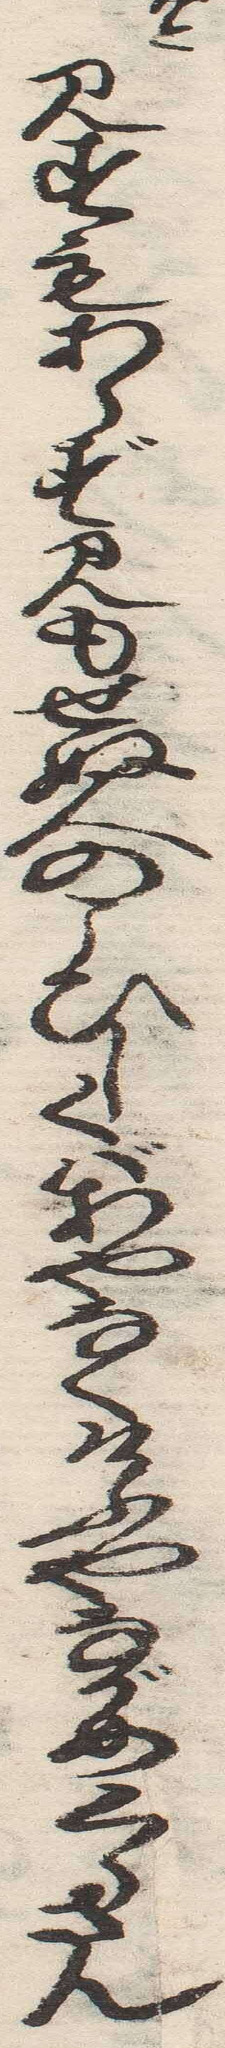古今見すもあらず見もせぬ人のこひしくばあやなくけふやながめくらさん
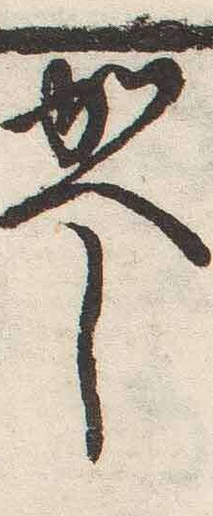かへし
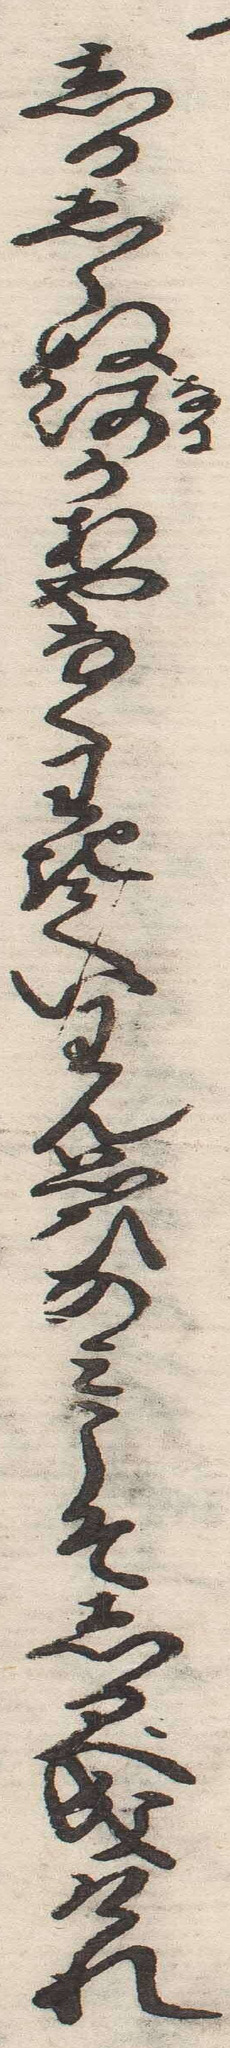しるしらぬ何かあやなくわきていわん思ひのみこそしるべ成けれ
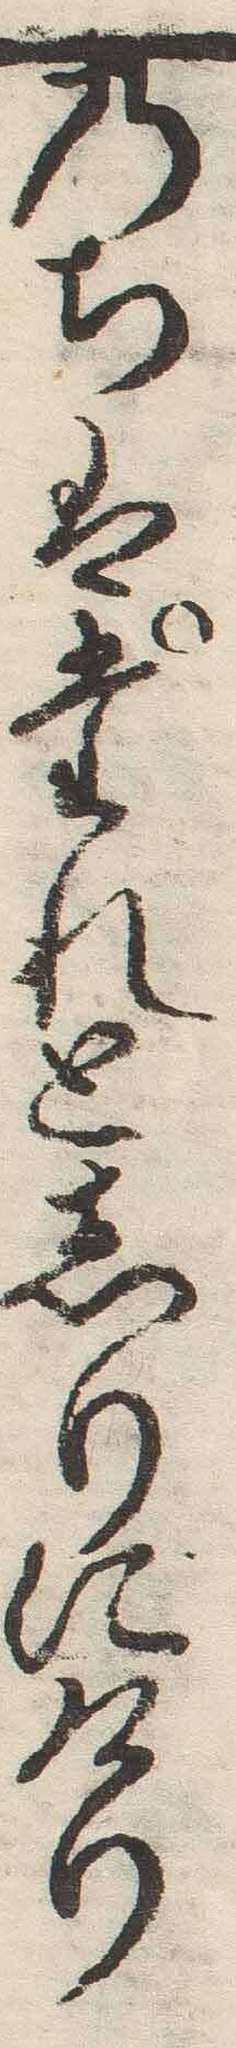のちは。たれとしりにけり
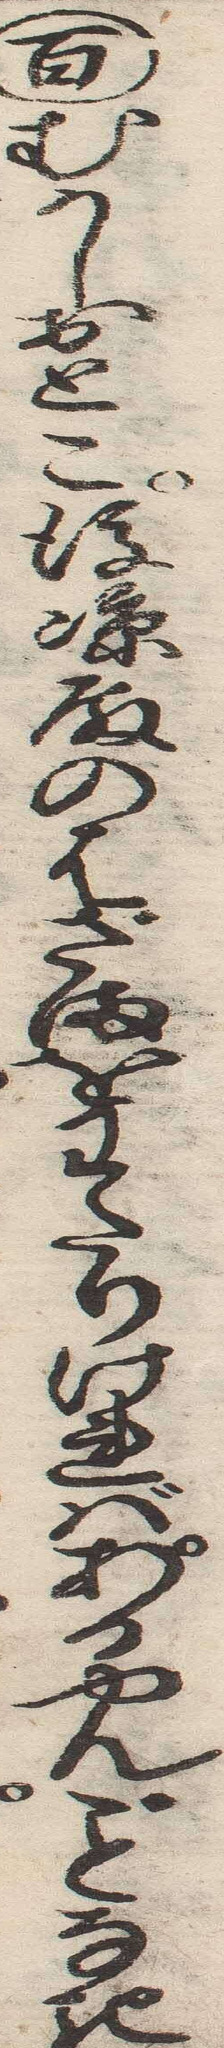百むかしおとこ。後涼殿のはざまをわたりければ。あるやんごとなき
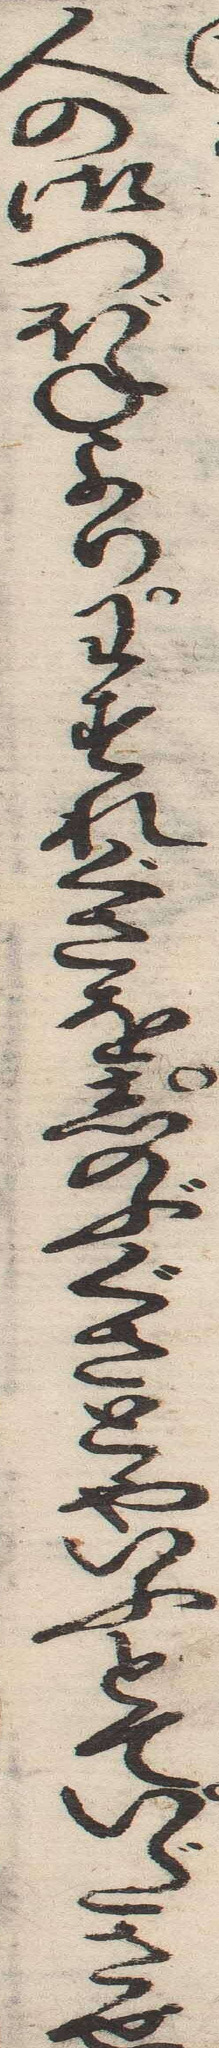人の御つぼねより。わすれぐさを。しのぶぐさとやいふとて。いださせ

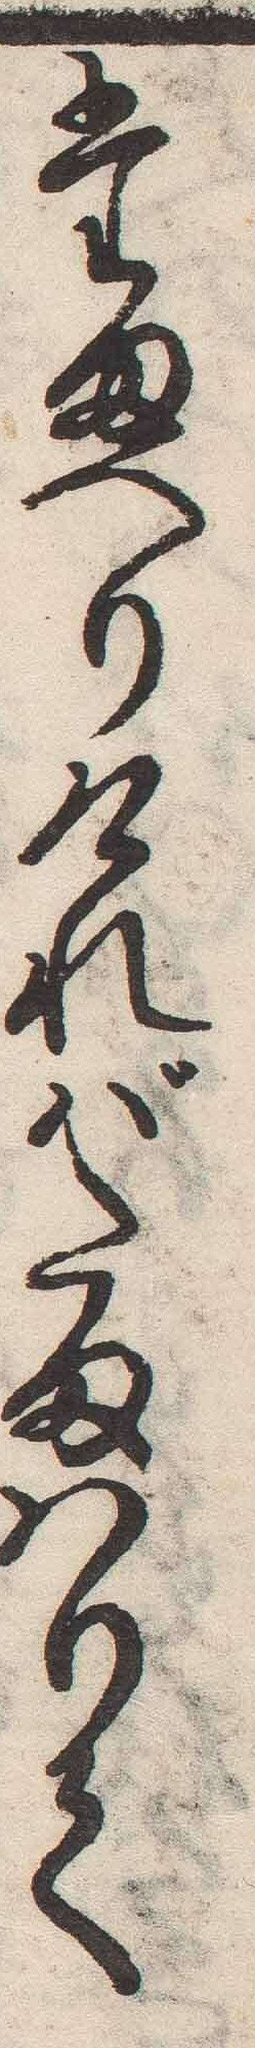たまへりければたまはりて
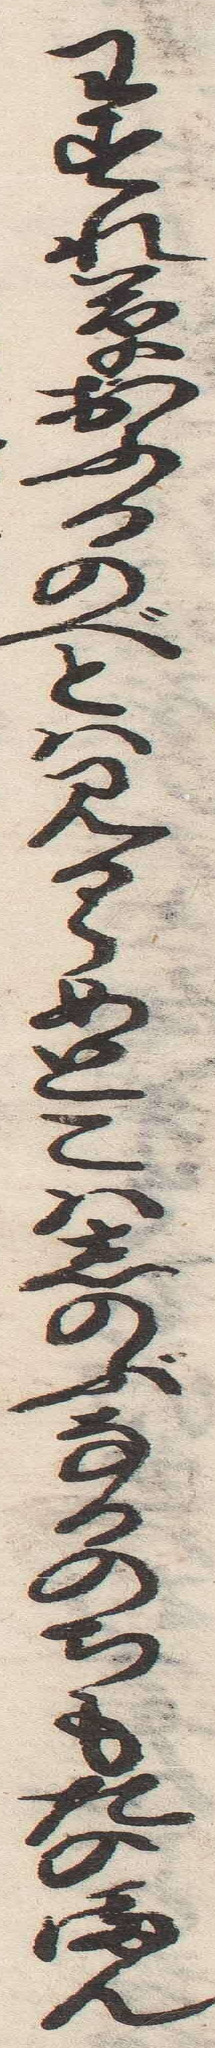わすれ草おふるのべとは見るらめとこはしのぶなるのちもたのまん
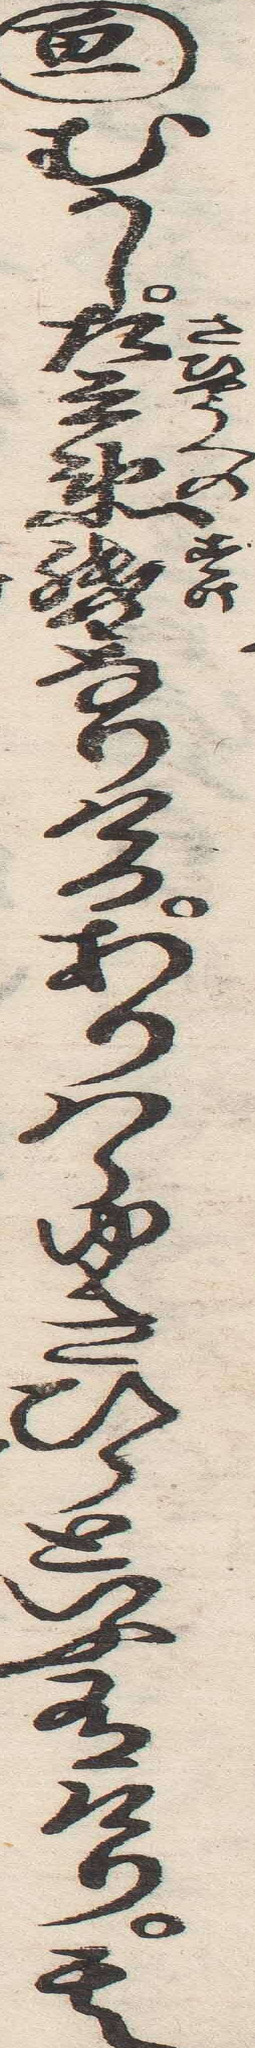百一むかし。左兵衛督なりける。ありはらゆきひらといふ有けり。其
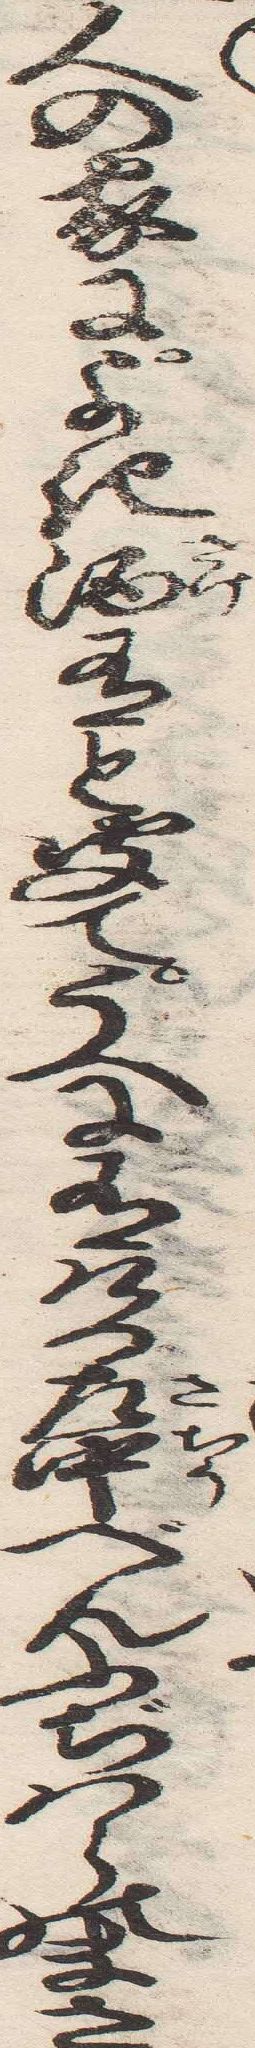人の家に。よき酒有と聞て。うへに有ける左中べんふぢはらのまさ
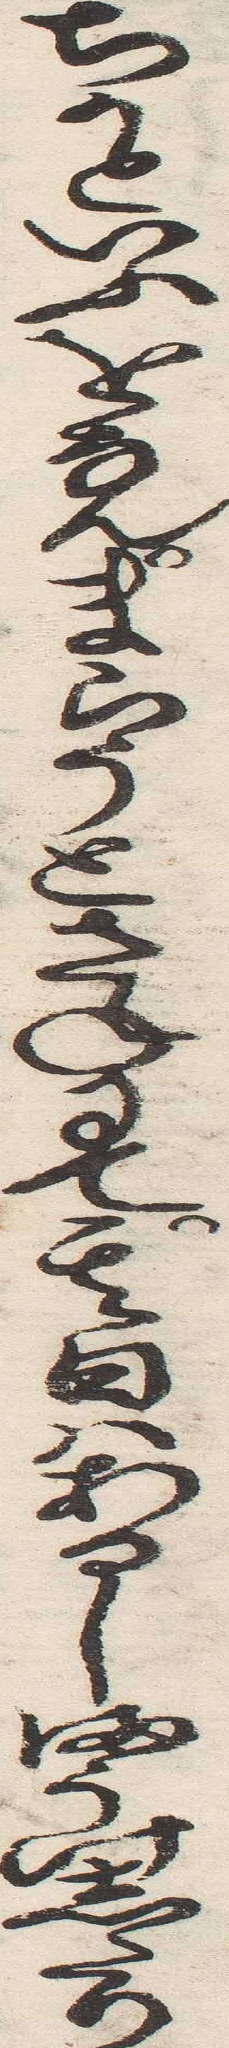ちかといふをなん。まらうとさねにて。其日はあるしまうけしたり
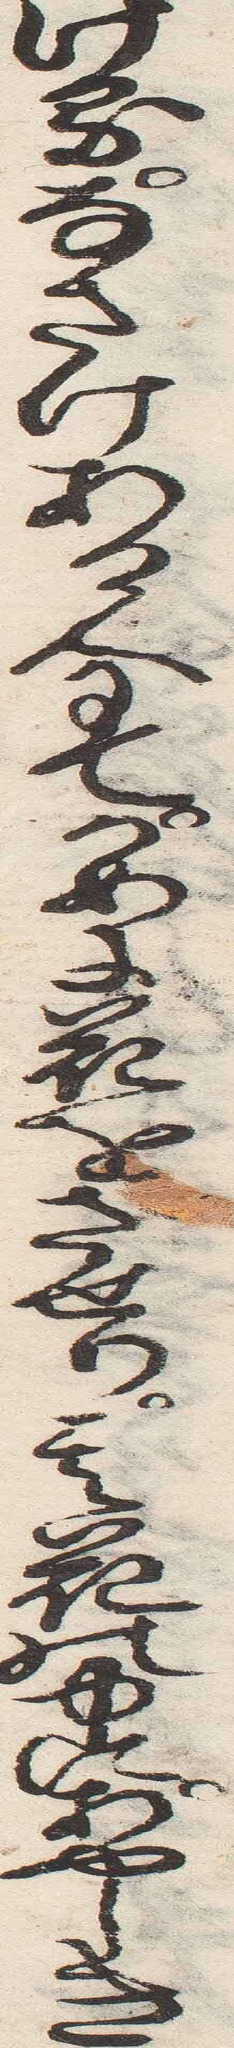ける。なさけある人にて。かめに花をさせり。其花の中に。あやしき
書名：伊勢物語
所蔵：東京学芸大学附属図書館 国文学研究資料館
